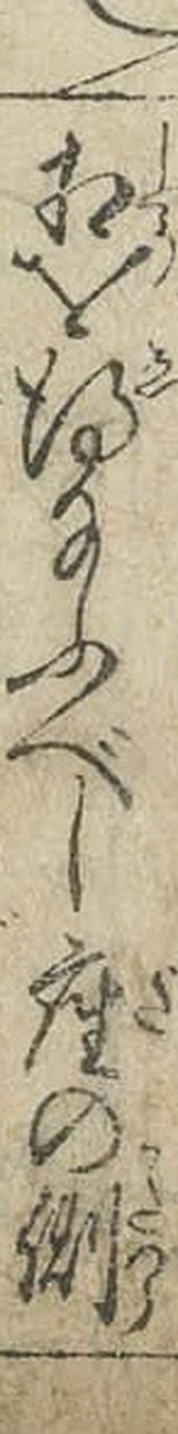相を得給ふべし座の側
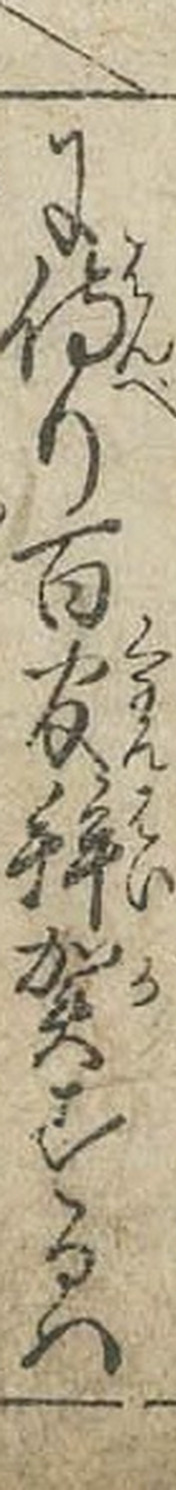に侍り百官拝賀するは
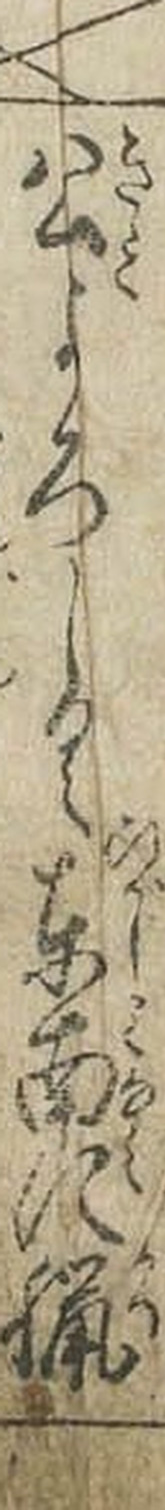公よろしく東南に猟
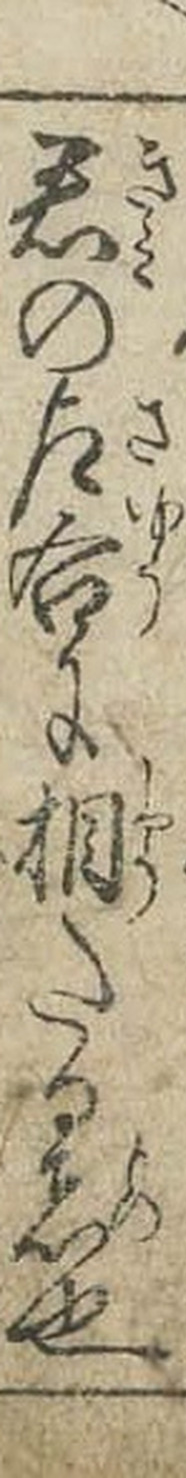君の左右に相たる者也
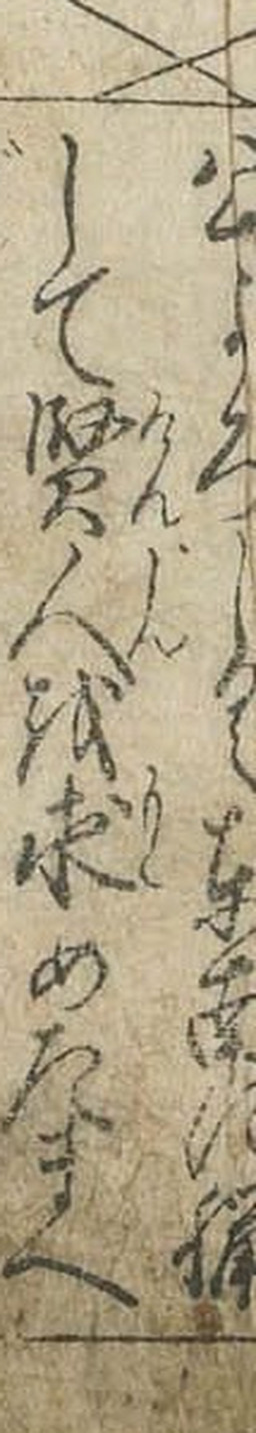して賢人を求めたまへ
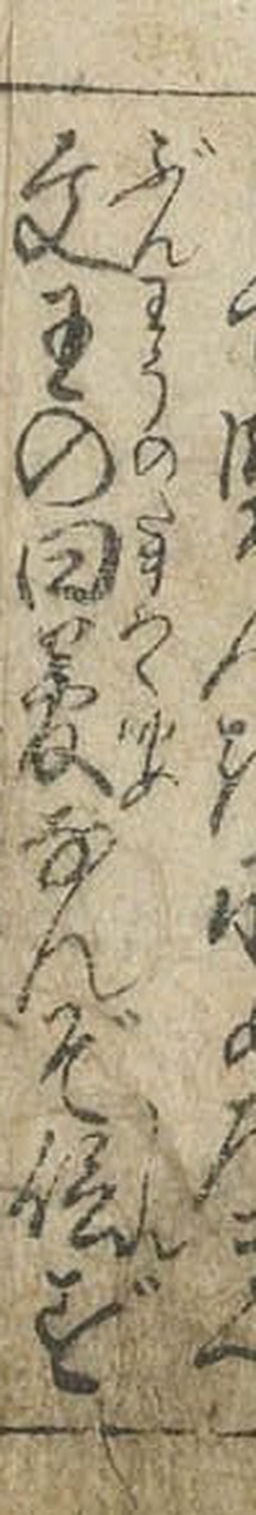文王の曰夢なんぞ信ず
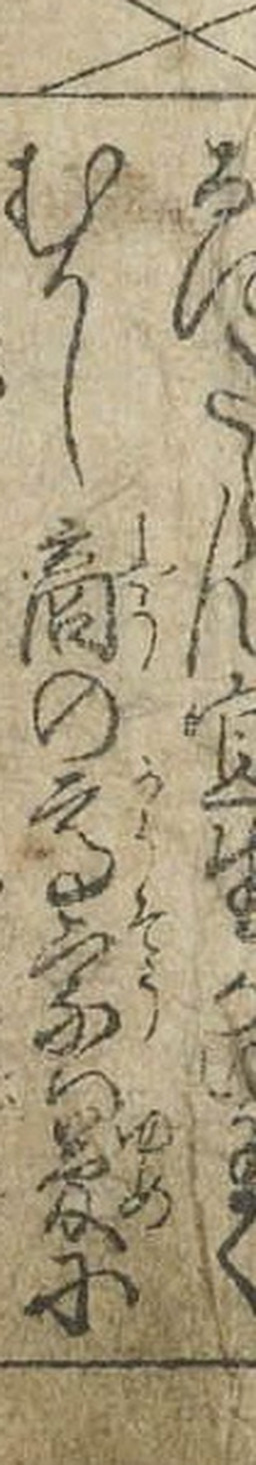むかし商の高宗は夢に
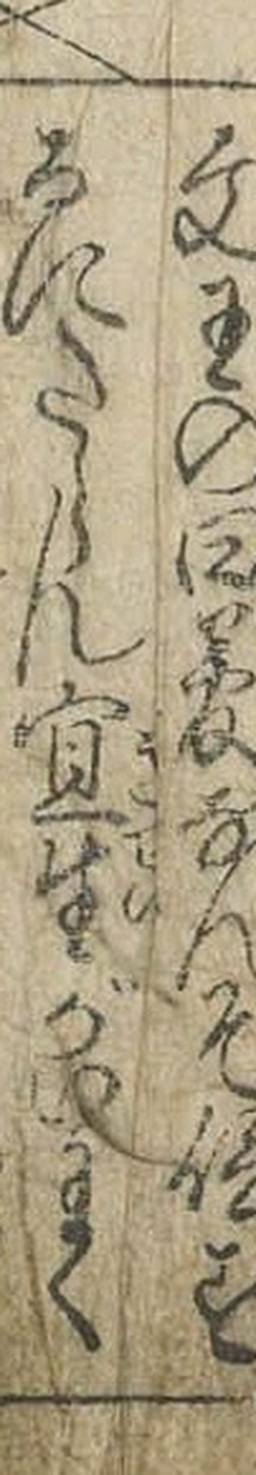るにたらん宜生がいわく
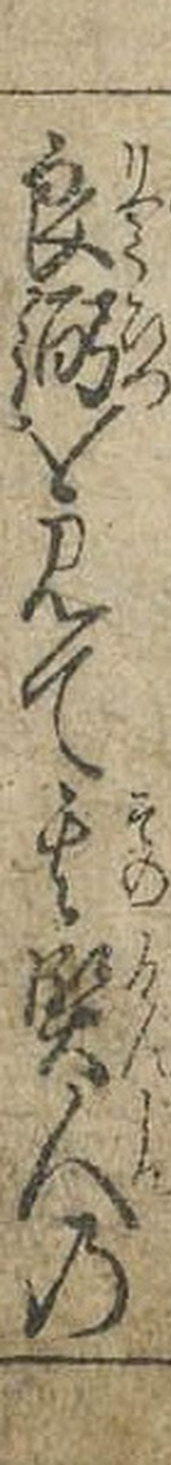良弼を見て其賢人の

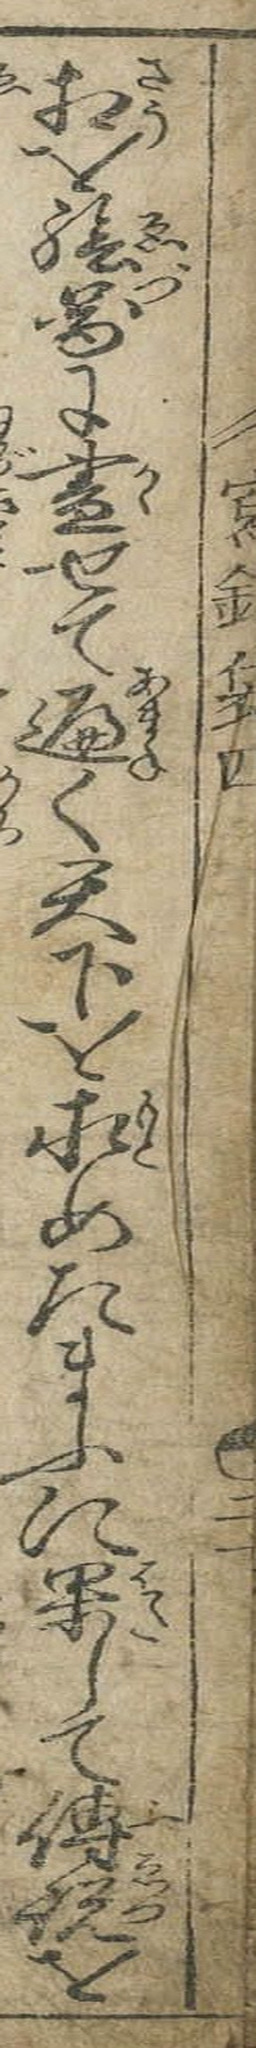相を絵図に画せて遍く天下を求めたまふに果して傅説を
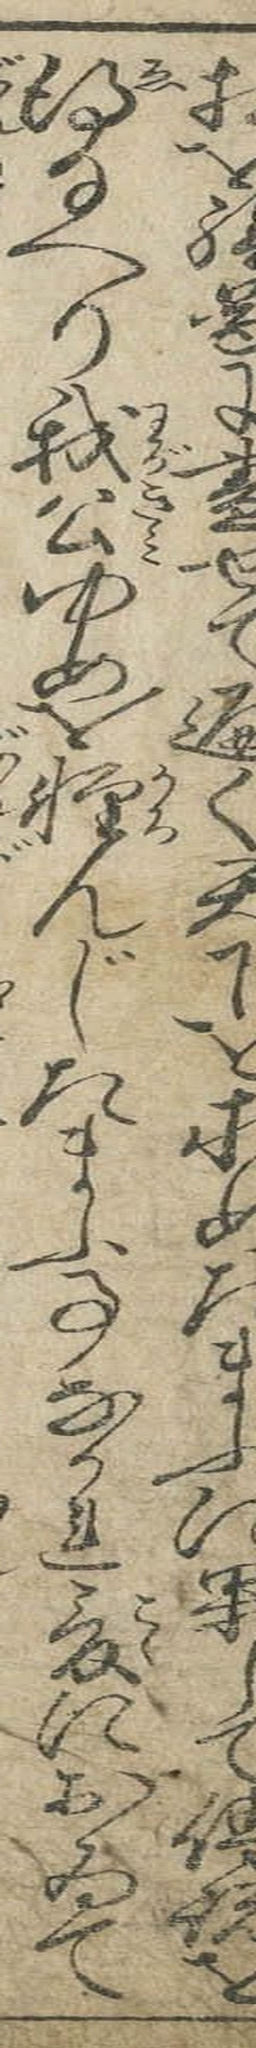得給へり我公ゆめを軽んじたまふ事なかれ爰におゐて
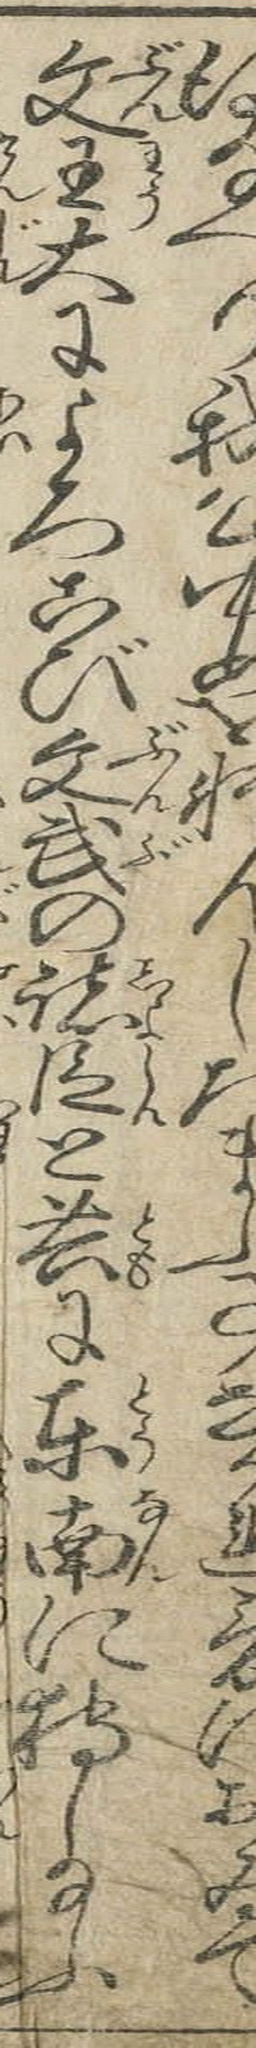文王大によろこび文武の諸臣と共に東南に狩し給ふ
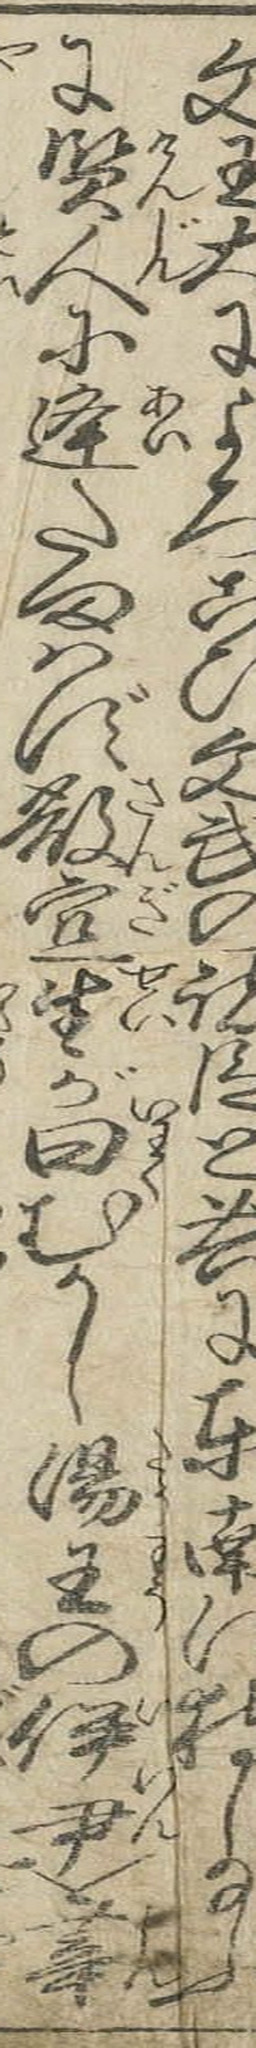に賢人に逢たまはず散宜生が曰むかし湯王の伊尹を莘
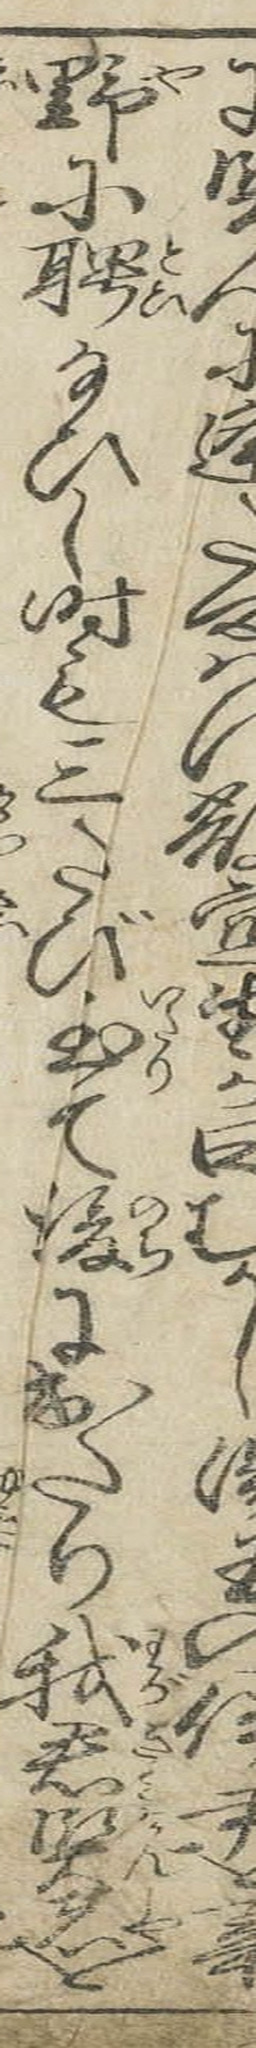野に聘給ひし時も三たび至て後に出たり我君賢者を
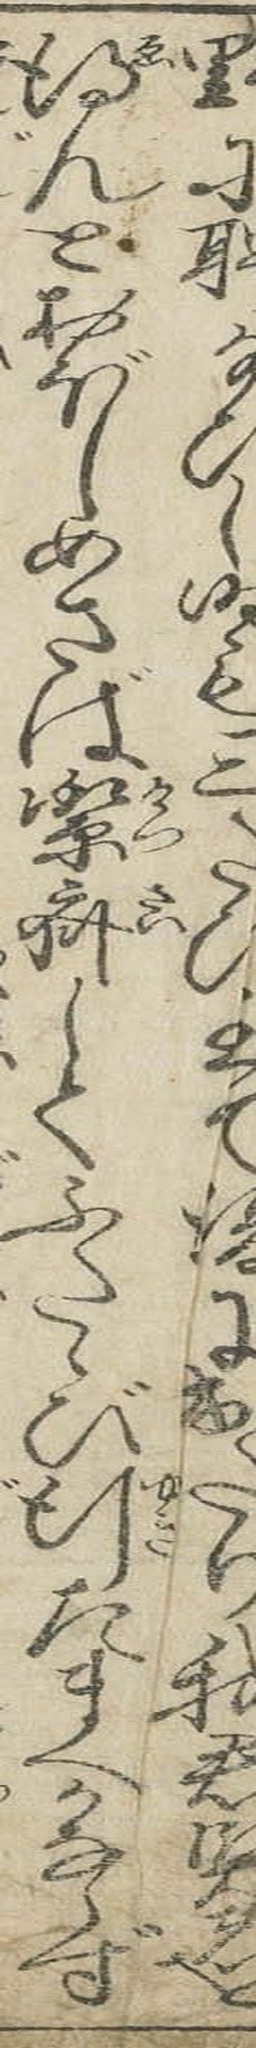得んとおぼしめさば潔斎してふたゝび行たまへかならず
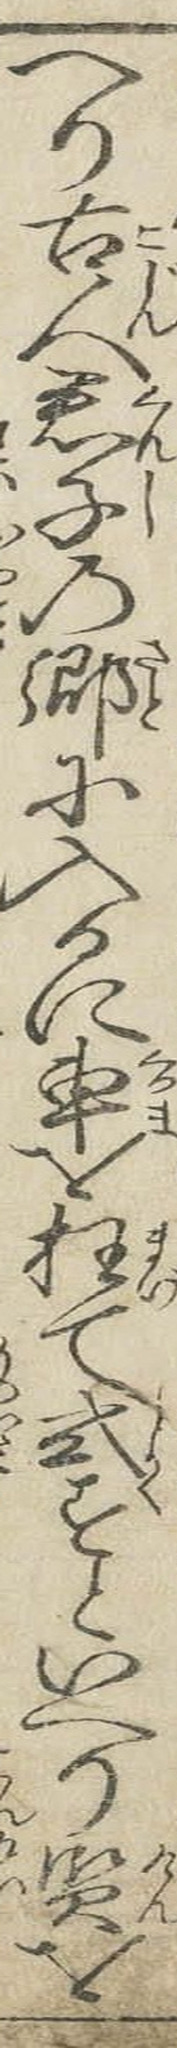へり古人君子の郷に入るに車を枉て式すといへり賢を
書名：絵本写宝袋 9巻 4之巻
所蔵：東京学芸大学教育コンテンツアーカイブ
